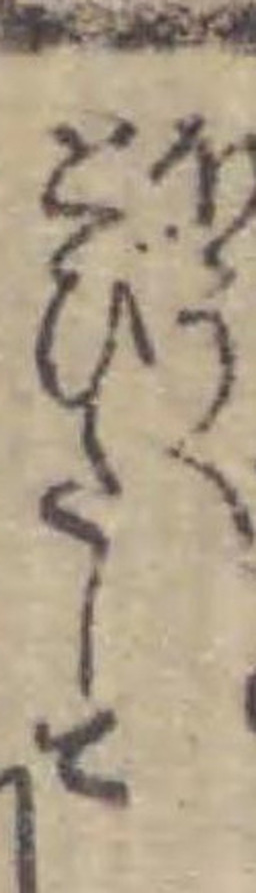とびたして
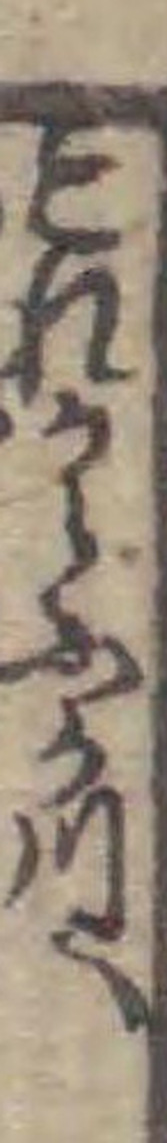これからふか川へ
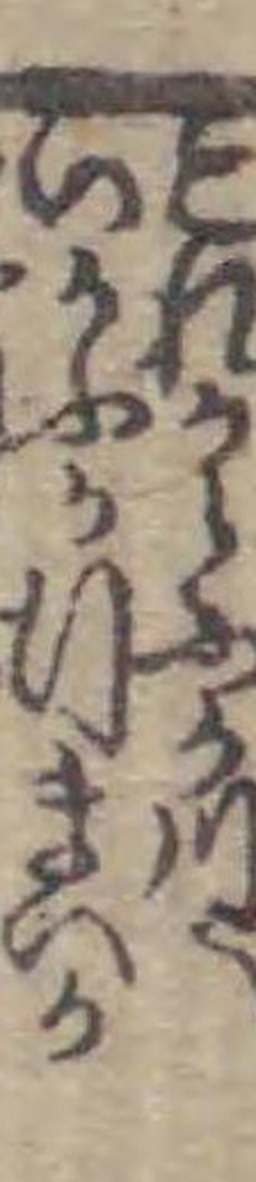いかうか行まいか
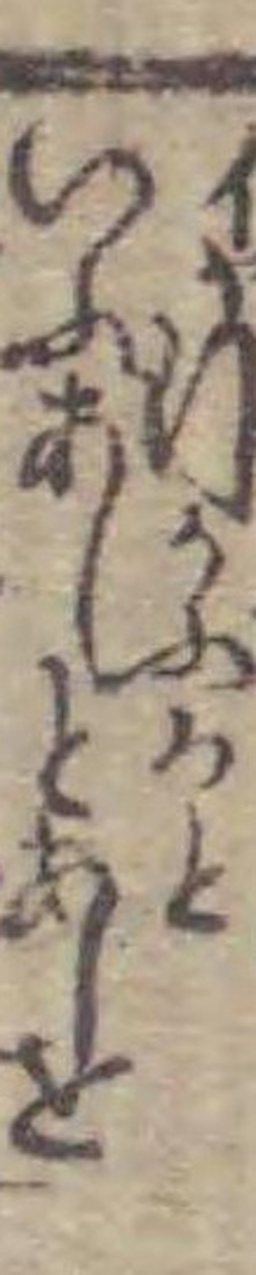いふあしとあしを
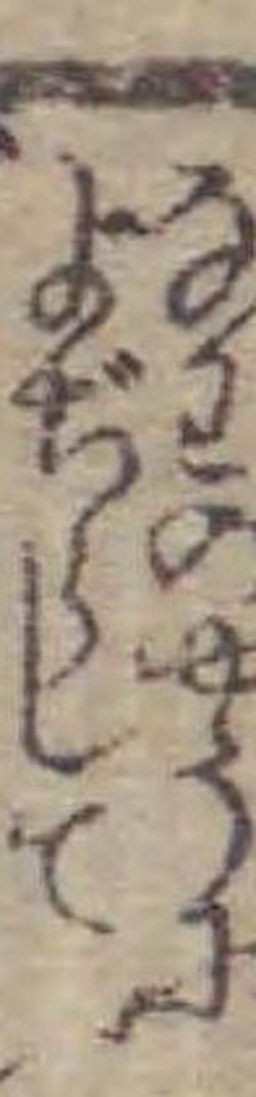よぢらして
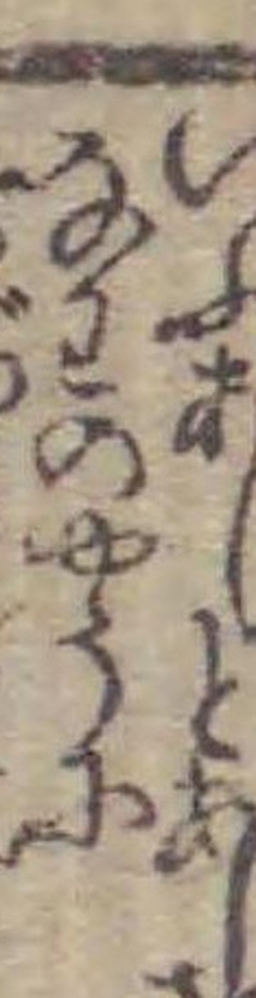なわのやうに
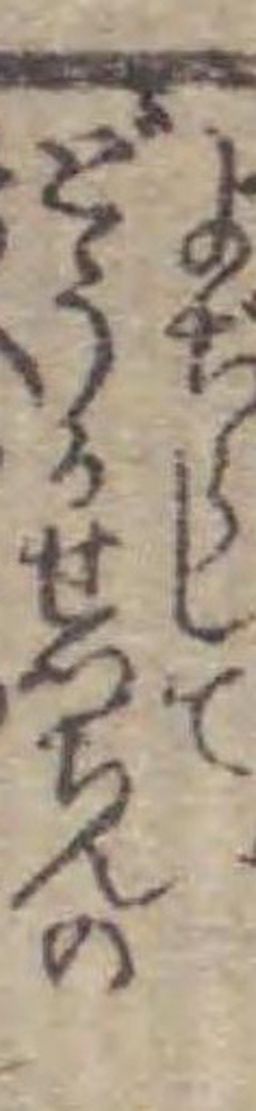どうかせつちんの
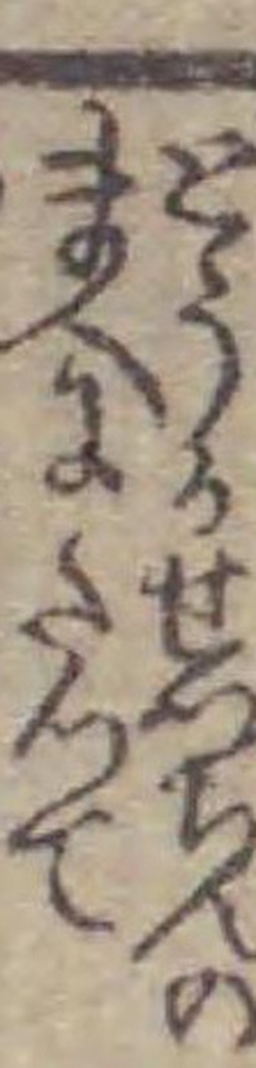まへにたつて
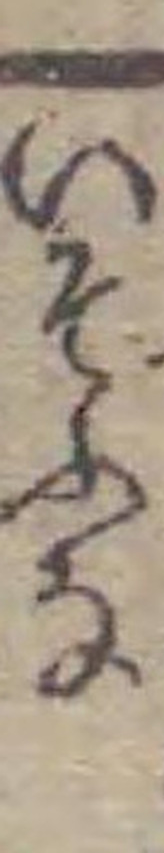いそふな
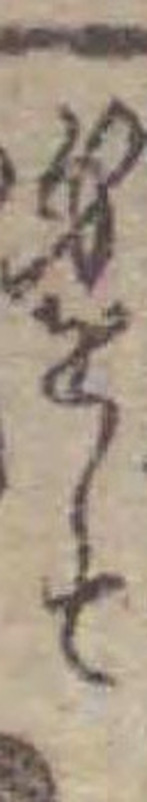身をして
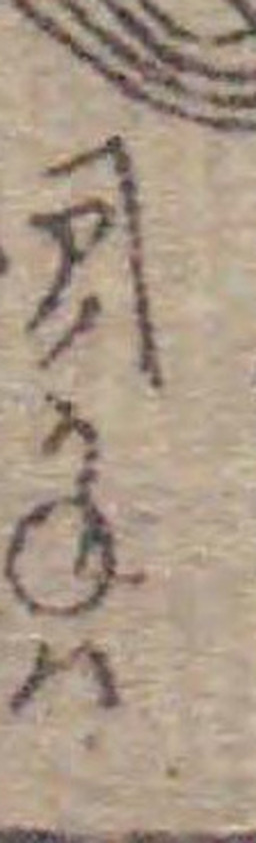〽アノかねは
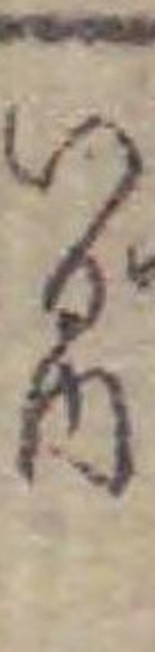いる内
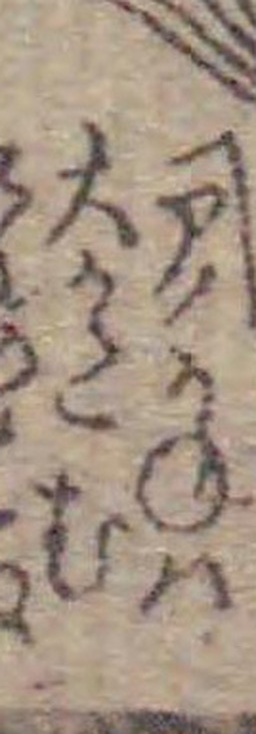大かたむ
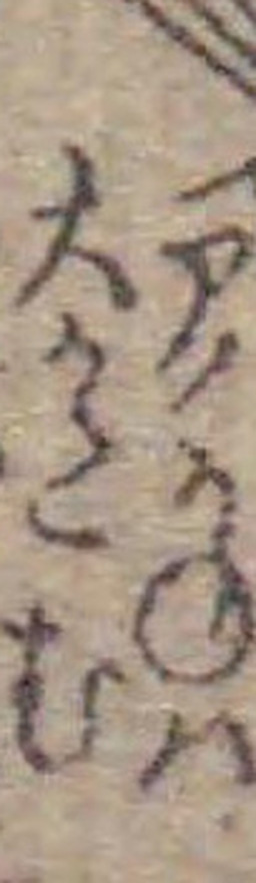大かたむ
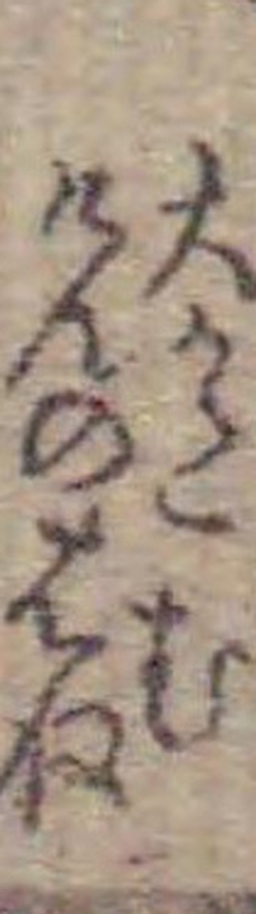けんのはね
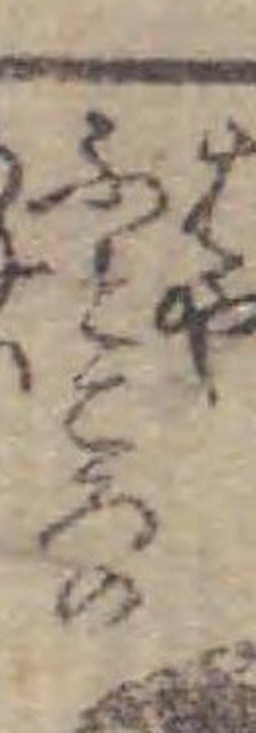ふところの
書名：新鋳小判 : 3巻
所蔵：国立国会図書館 National Diet Library, JAPAN
